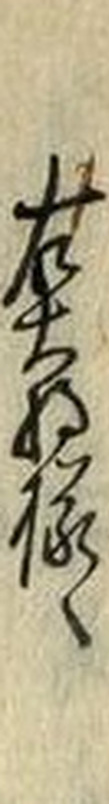右大将様へ
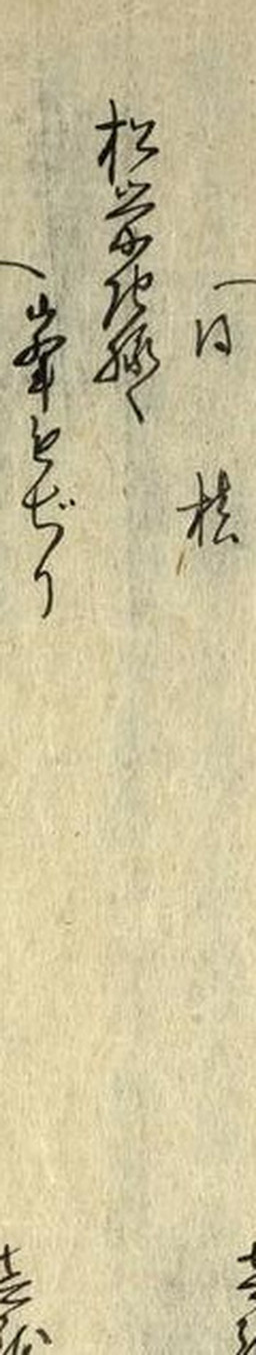松栄院様へ
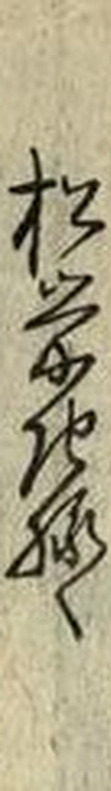松栄院様へ
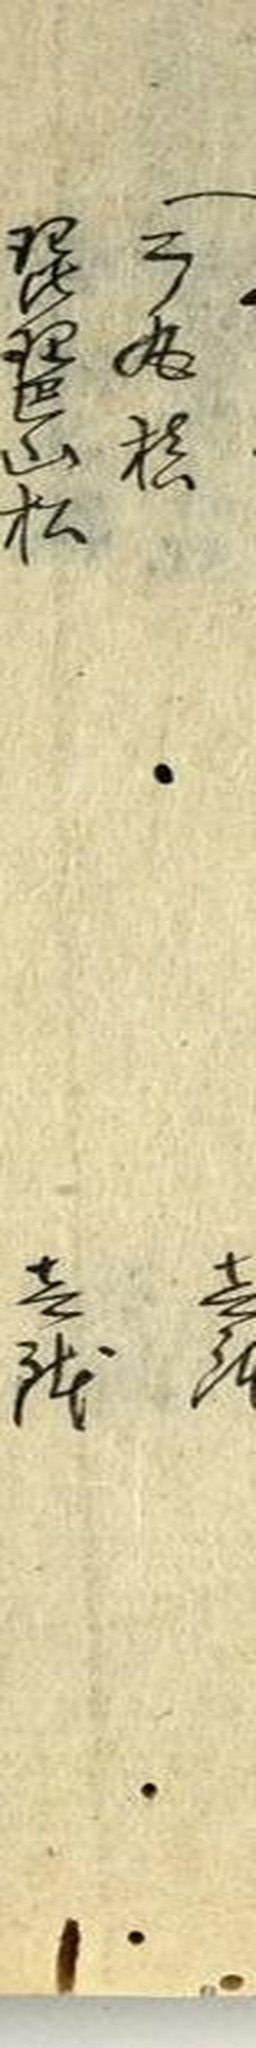琵琶山松壱鉢
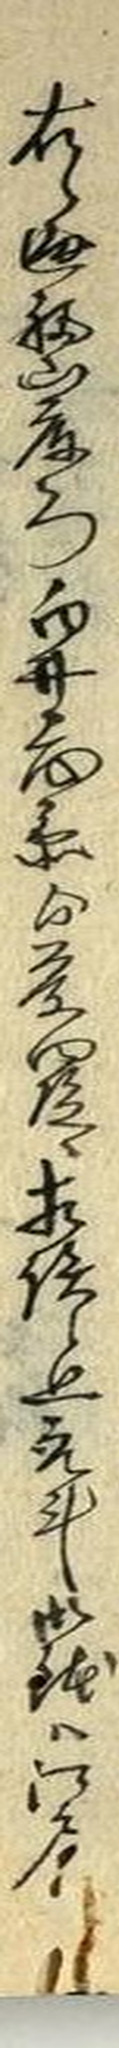右之通福山藤右衛門白井茂兵衛ゟ藤田殿へ相談之上取斗御鉢ハ江戸
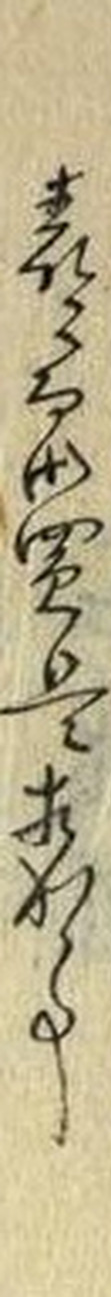表ニ而御買上ニ相成候事
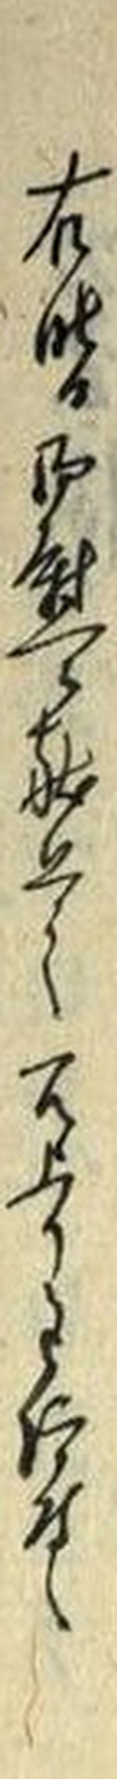右昨日御慰ニ献上之召上り被仰付候
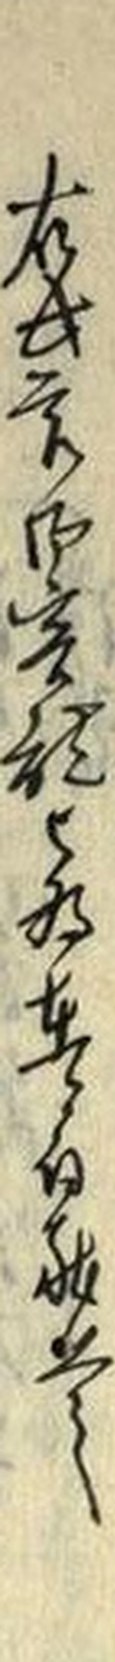右此節御容體被為在候付献上之
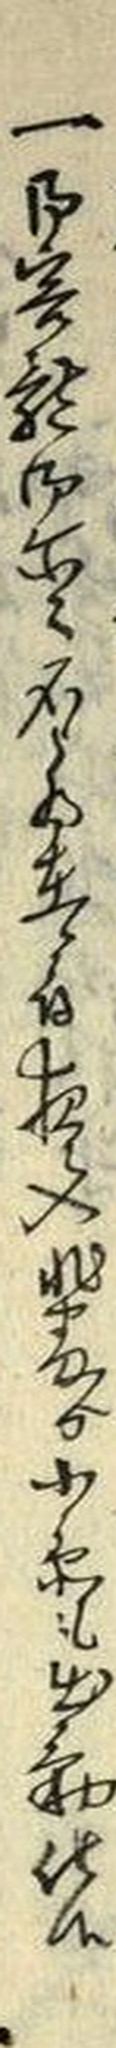一御容體御所々不被為在候ニ付夜ニ入非番ゟ小兵衛も出勤仕候
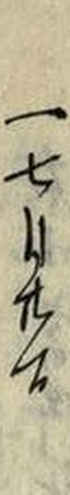一七月廿一日
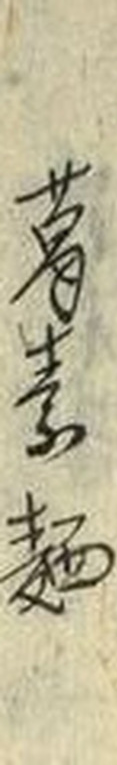葛素麺
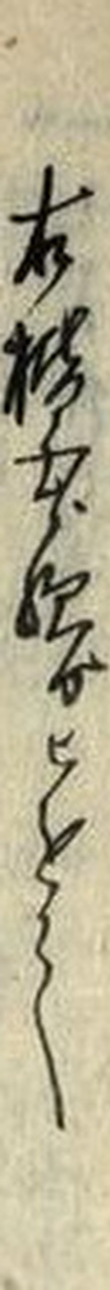右楷五郎様ゟ被進之
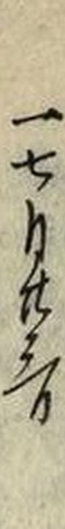一七月廿三日
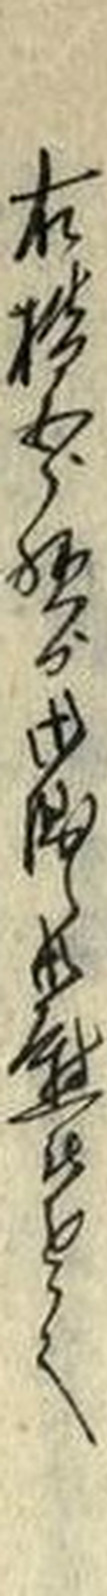右楷五郎様ゟ御側へ御慰被進之
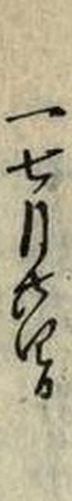一七月廿四日
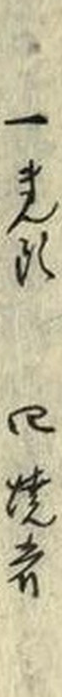一まん頭四焼肴
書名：少傅日録抄（斉善付側向頭取日記、江戸并道中、初入在国、逝去後…
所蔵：福井県文書館 Fukui Prefectural Archives
